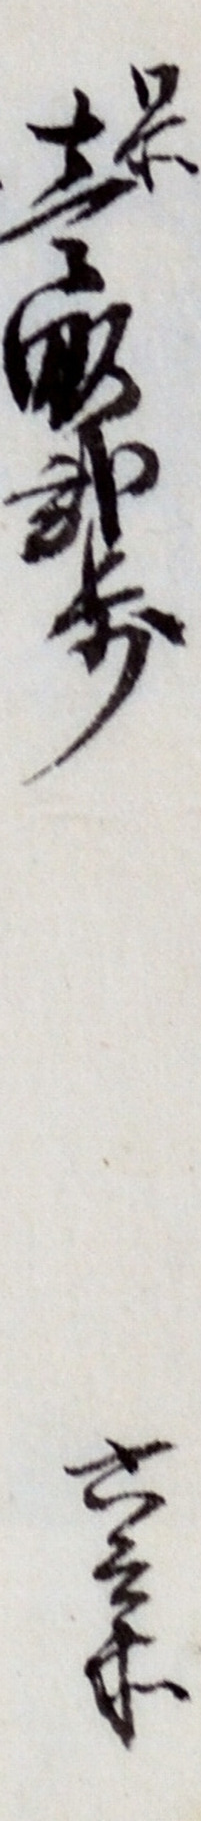壱畝弐歩六兵衛
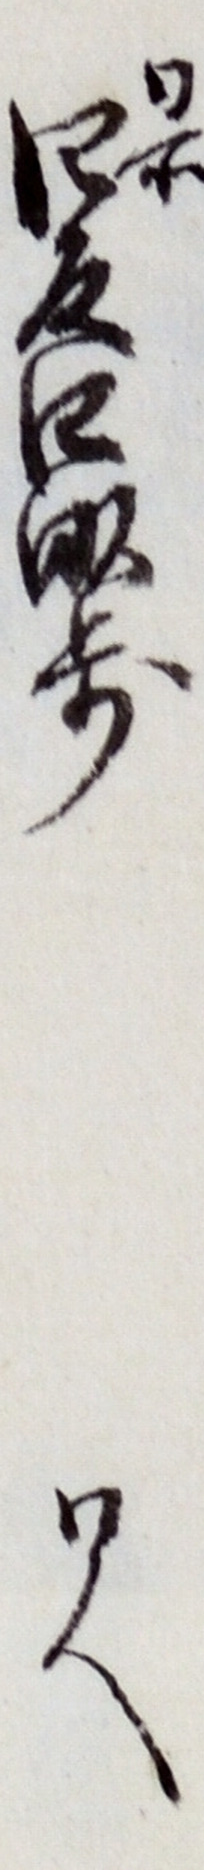四反四畝歩同人
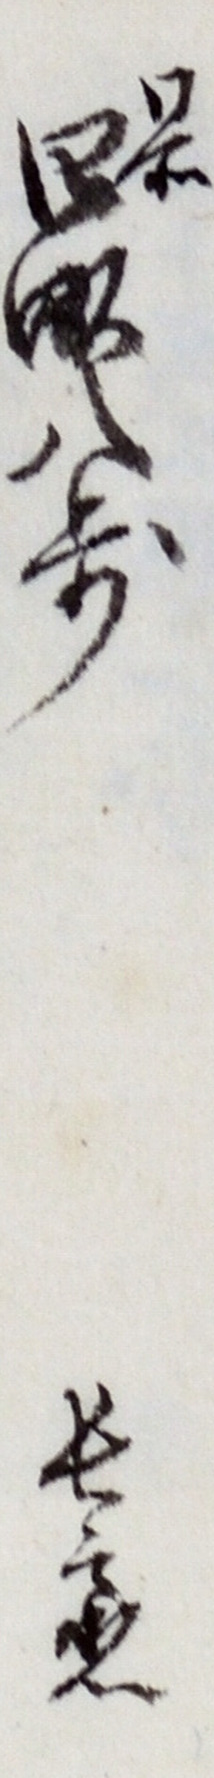四畝八歩長之烝
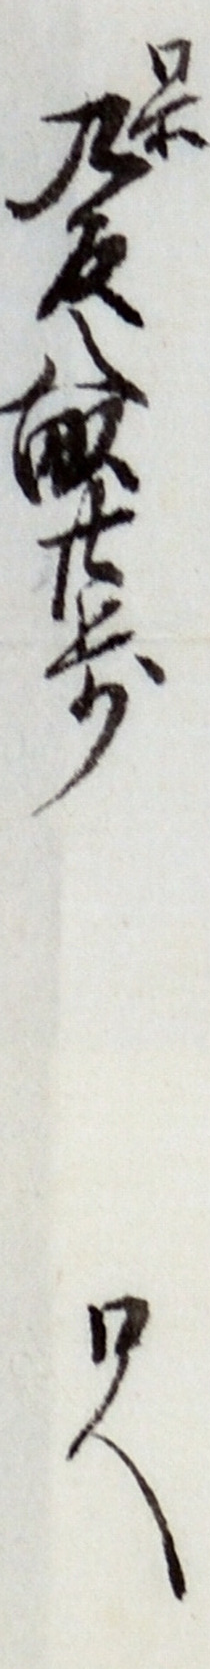九反八畝廿歩同人
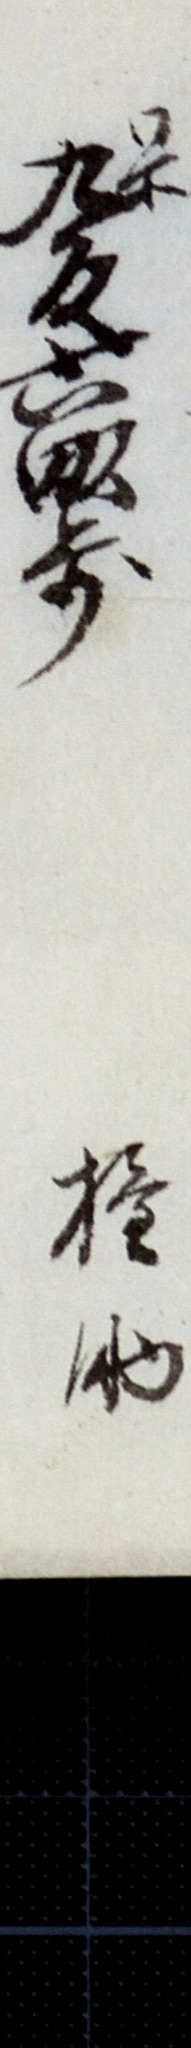九反六畝歩権助
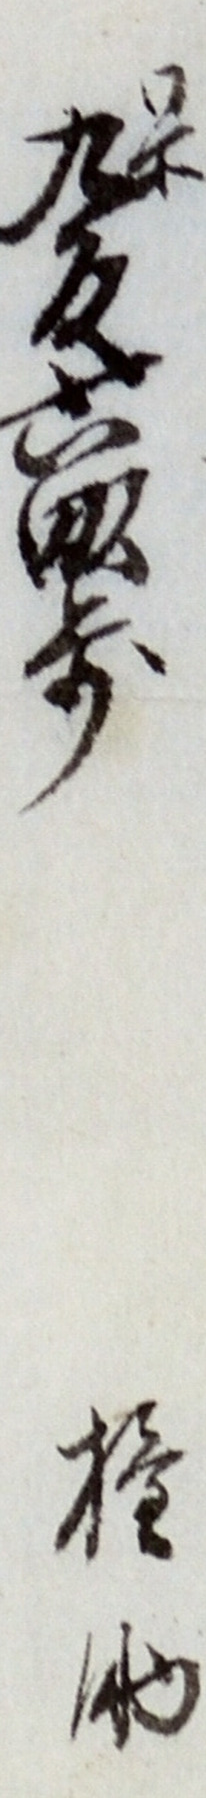九反六畝歩権助
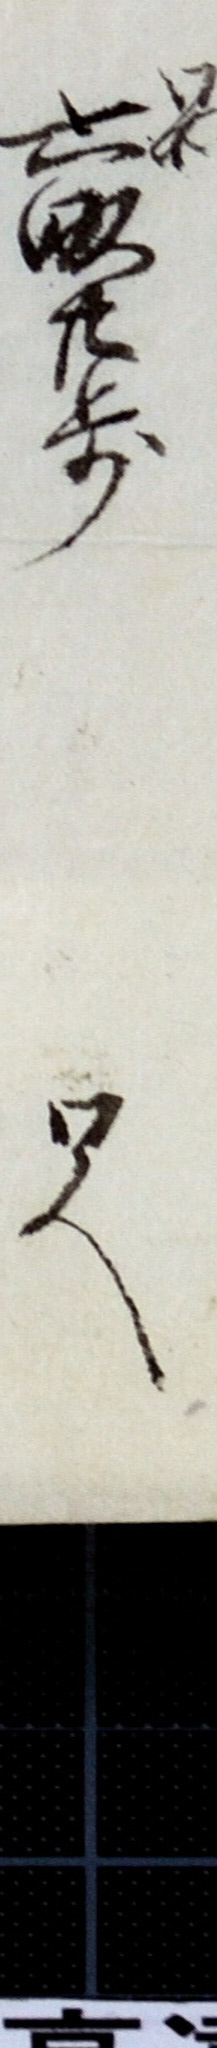六畝廿歩同人
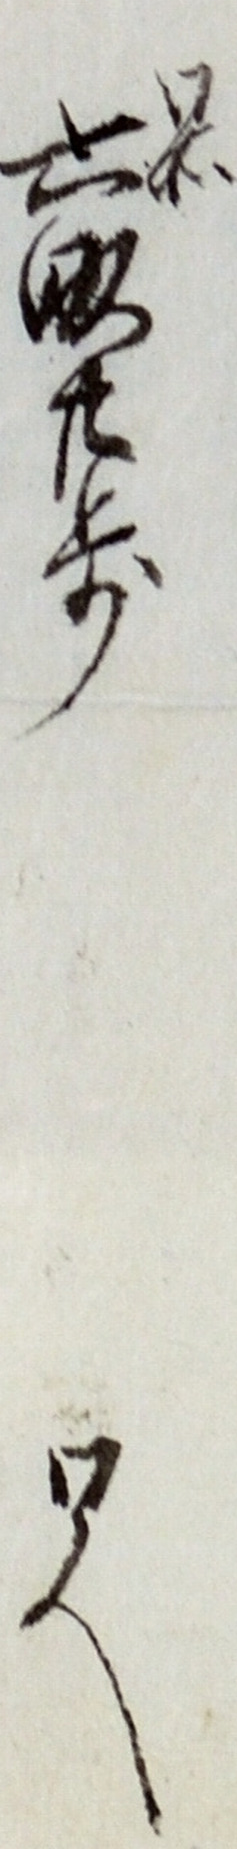六畝廿歩同人

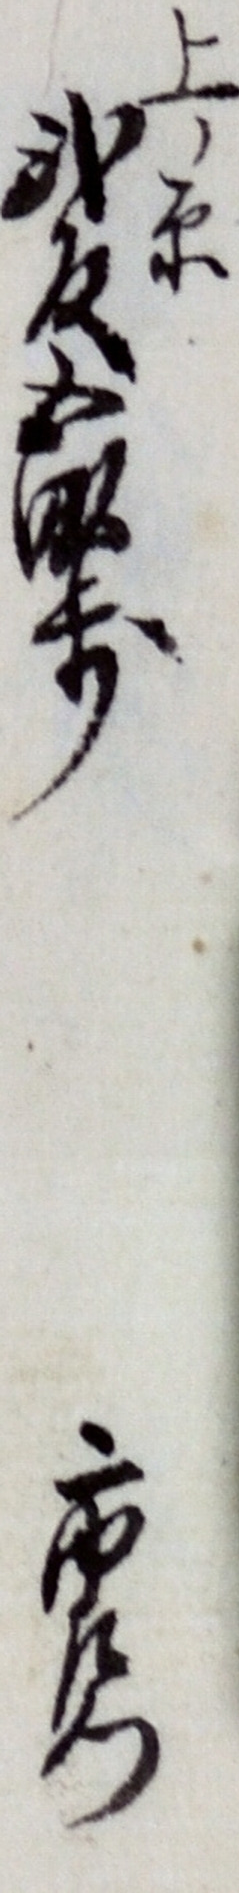弐反五畝歩市左衛門
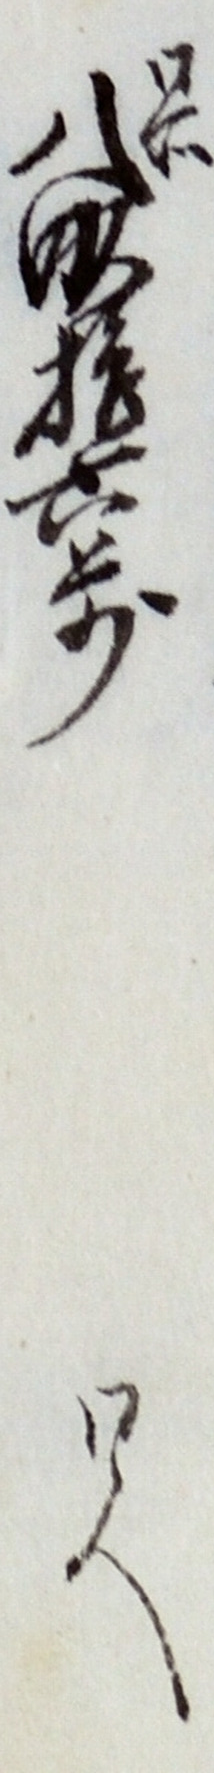八畝拾六歩同人
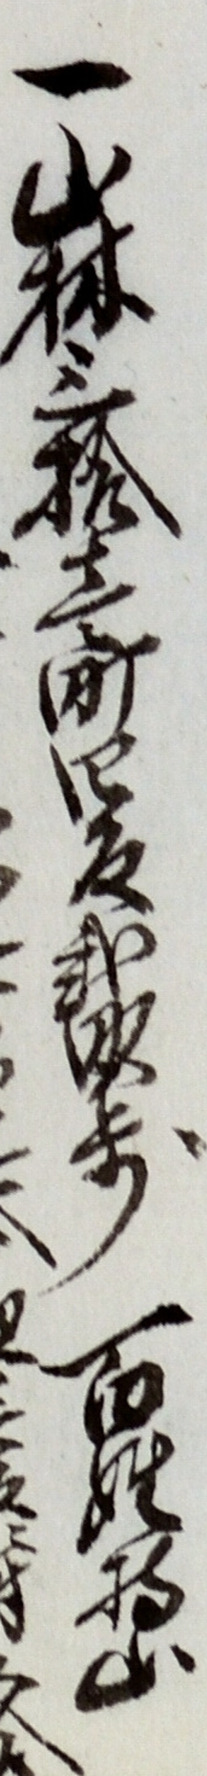一山林三拾壱町四反弐畝歩百姓持山
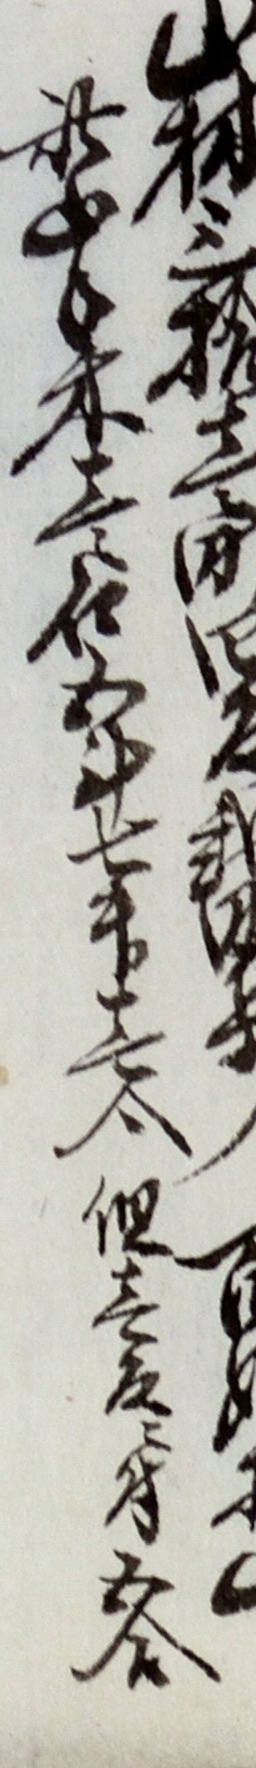此山手米壱石五斗七升壱合但壱反ニ付五合
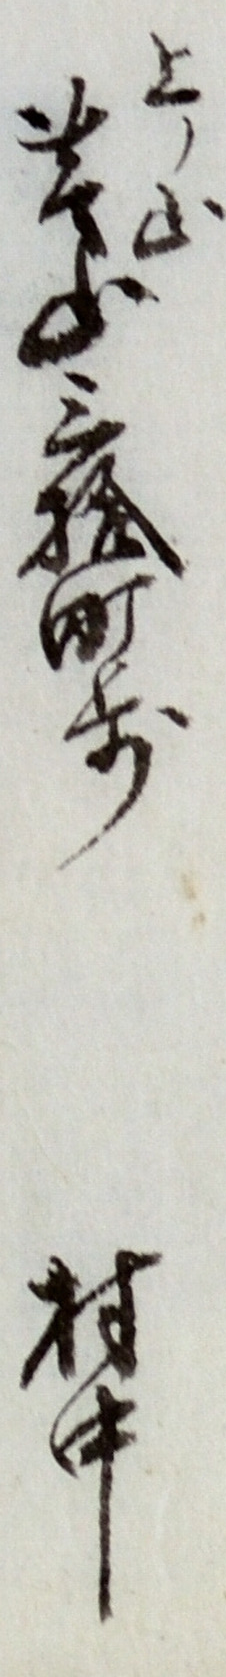芝山三拾町歩村中

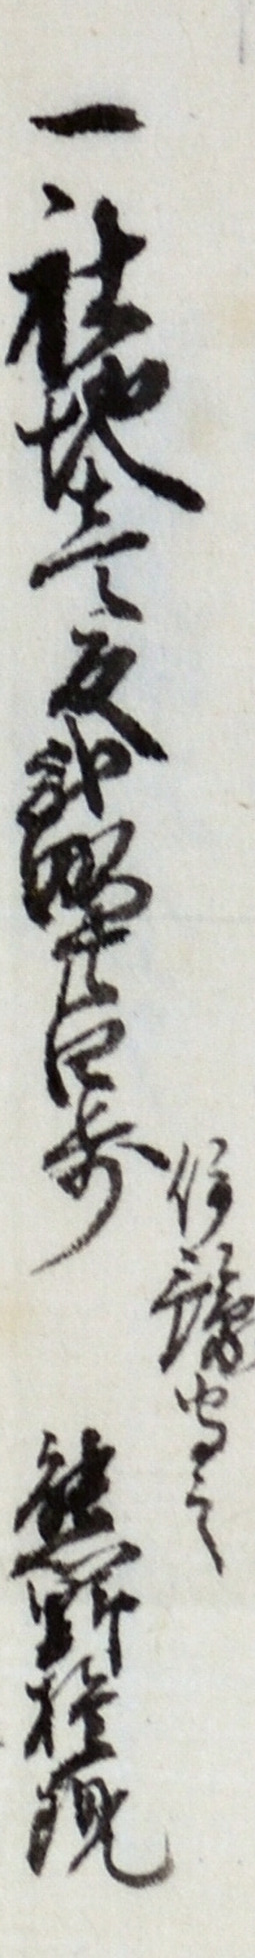一社地壱反弐畝廿四歩熊野権現
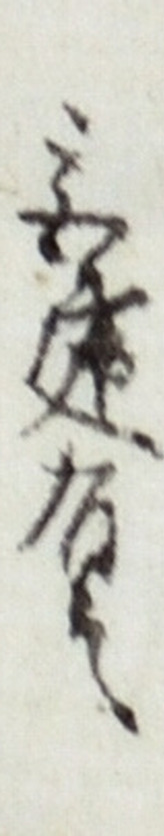宮建有之
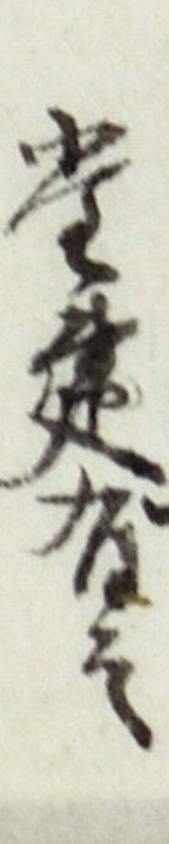堂建有之
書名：御領分中山林社地手控
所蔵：伊那市立高遠町図書館・合同会社AMANE
